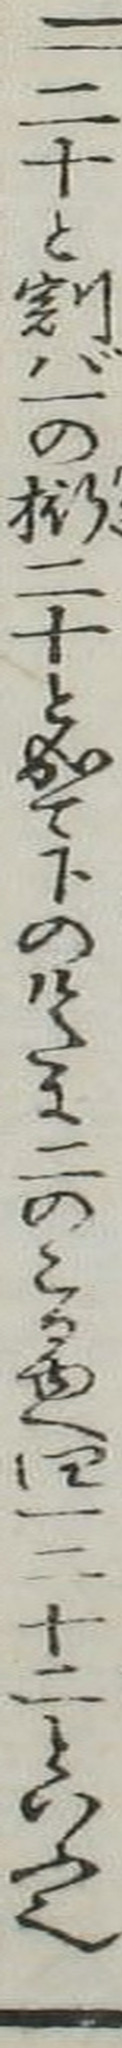二十と割ば一の桁二十と成て下のけたに二のこるゆへ四一二十二といふ也
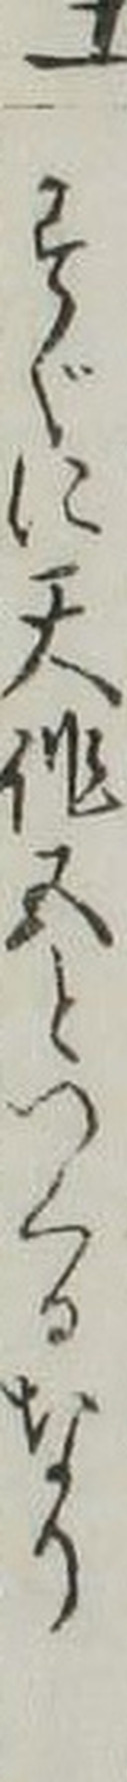すぐに天作五とつくるなり
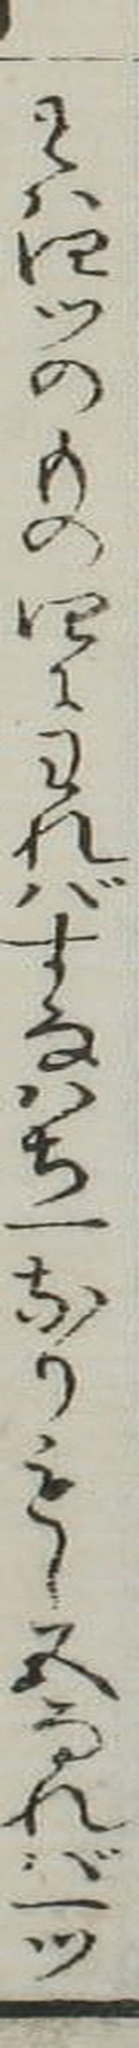四進一十とは四ツのもの四にわればすなはち一なりもし五なれば一ツ
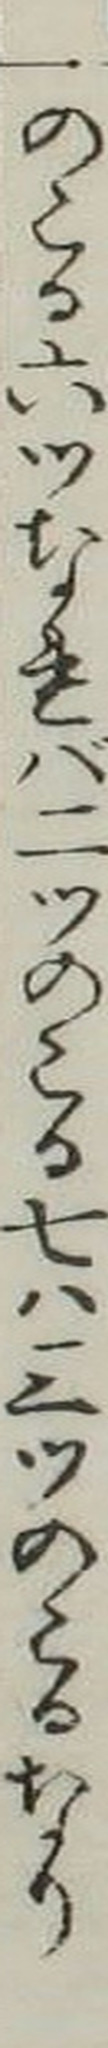のこる六ツなれば二ツのこる七は三ツのこるなり
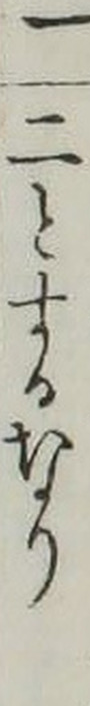二とするなり
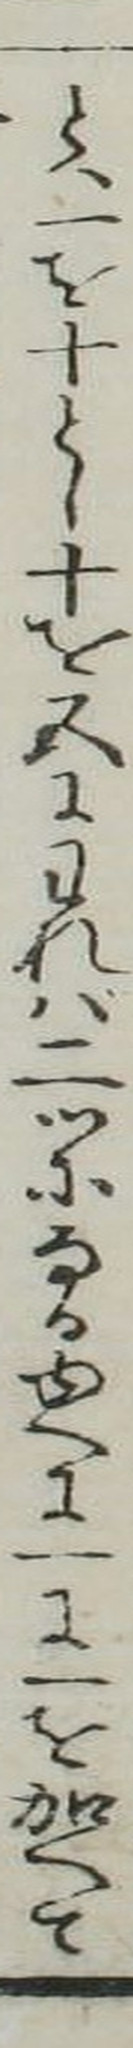五一加一とは一を十とし十を五にわれば二ツになるゆへに一に一を加へて
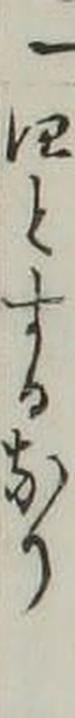四とするなり
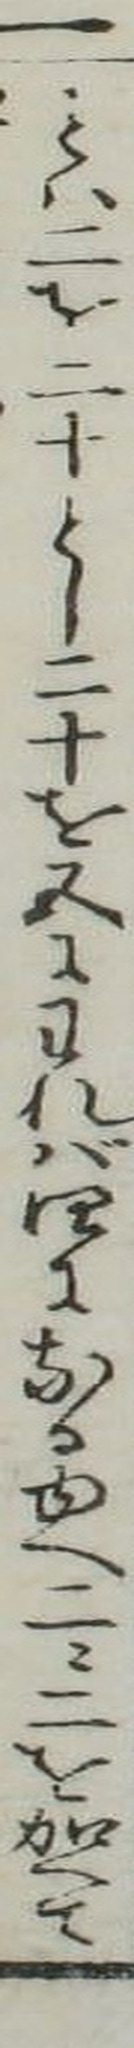五二加二とは二を二十とし二十を五にわれば四になるゆへ二に二を加へて

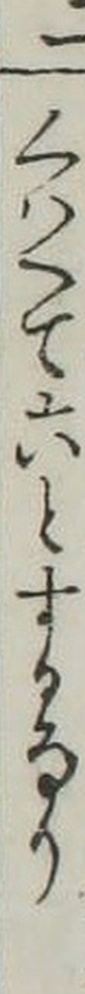くはへて六とするなり
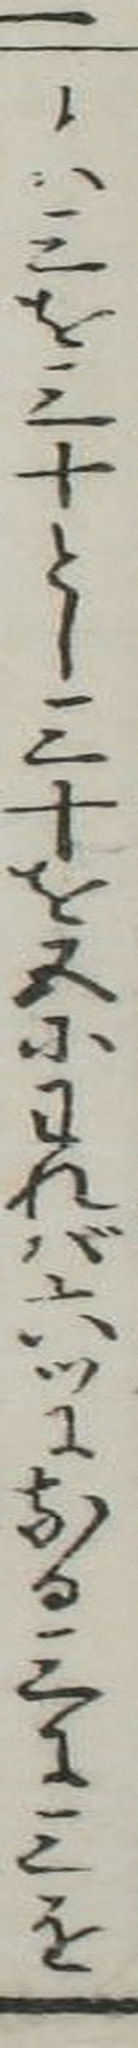五三加三とは三を三十とし三十を五にわれば六ツになる三に三を
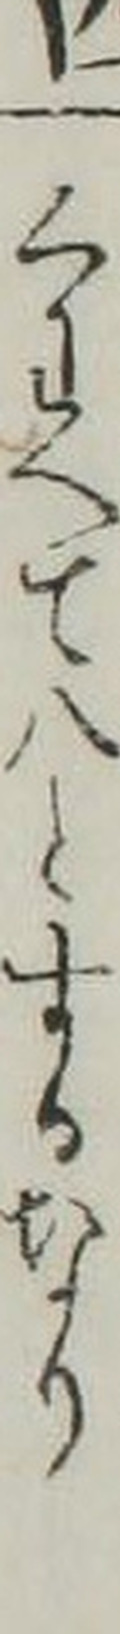くわへて八とするなり
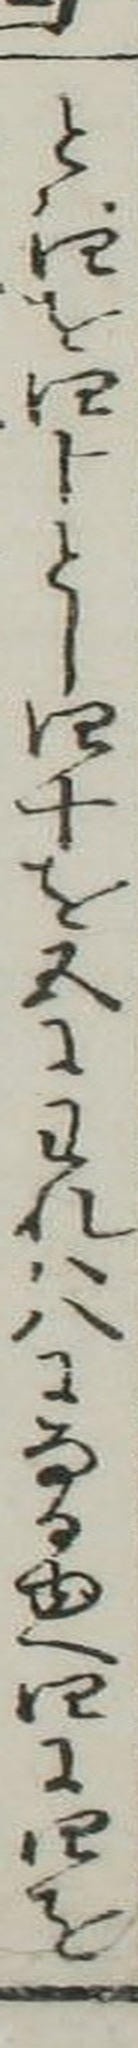五四加四とは四を四十とし四十を五にわれは八になるゆへ四に四を
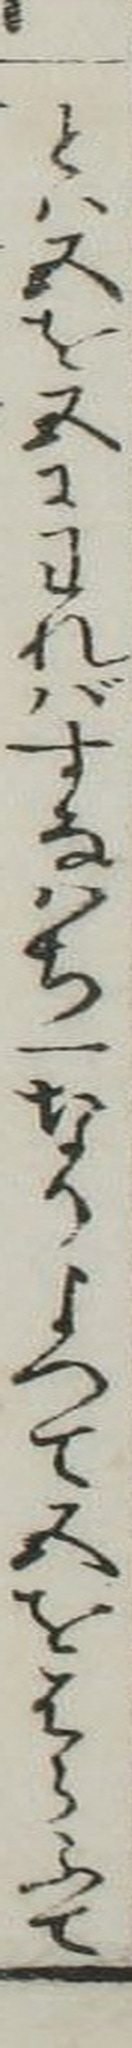五進一十とは五を五にわればすなはち一なりよつて五をはらふて
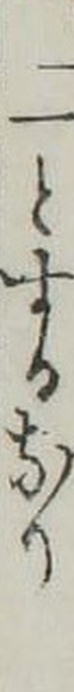一とするなり
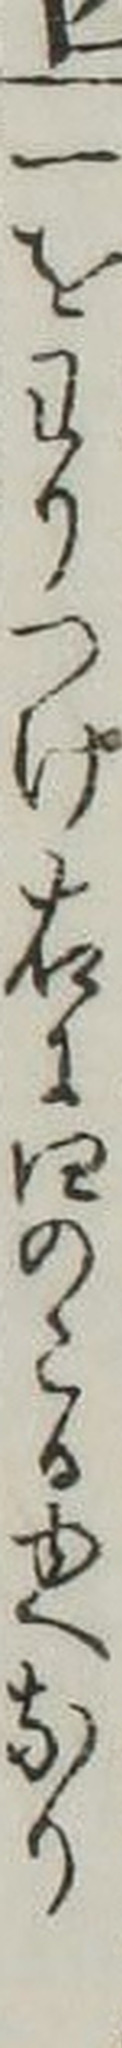一をわりつけ右に四のこるゆへなり
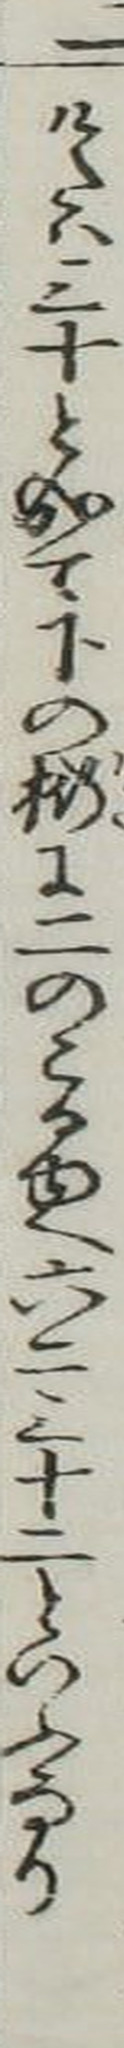けたは三十と成て下の桁に二のこるゆへ六二三十二といふなり
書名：宝玉塵劫記
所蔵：東京学芸大学教育コンテンツアーカイブ
